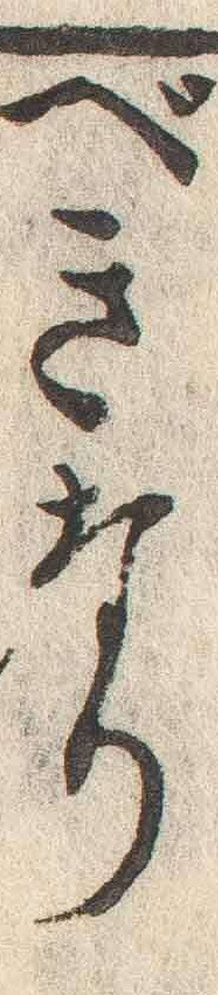べきなり
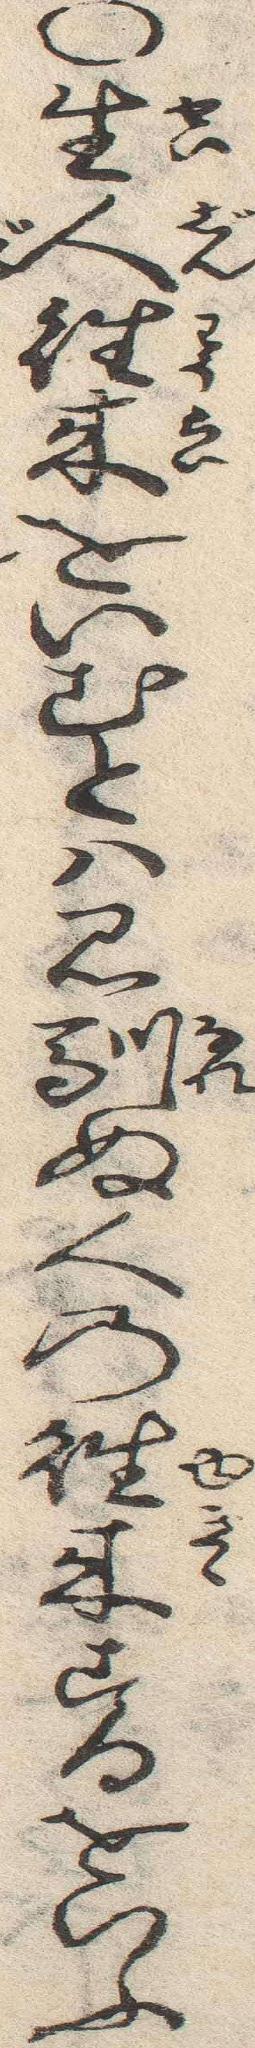○生人往来をいむとは見馴ぬ人の往来するをいふ
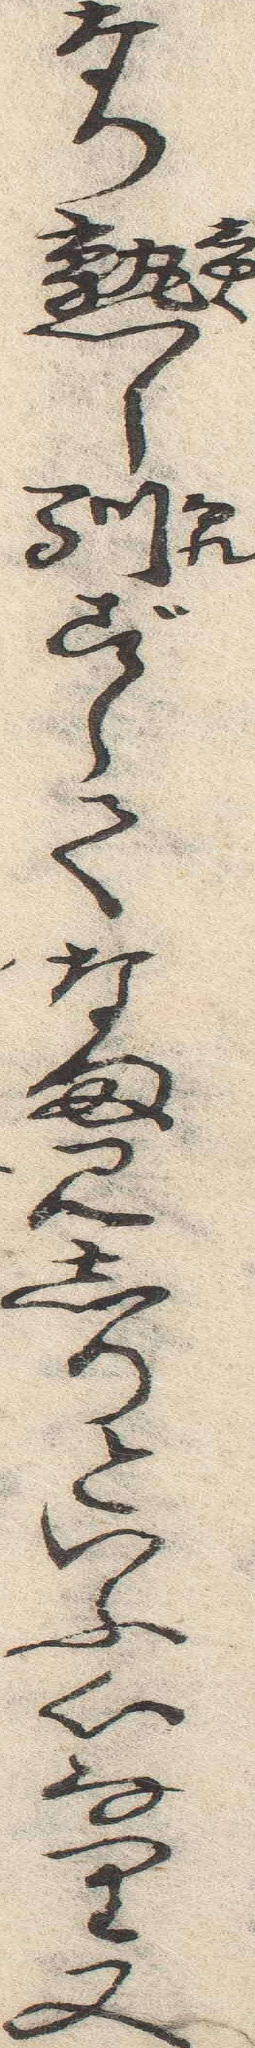なり熟し馴ずしてなま見しりといふ心なり又
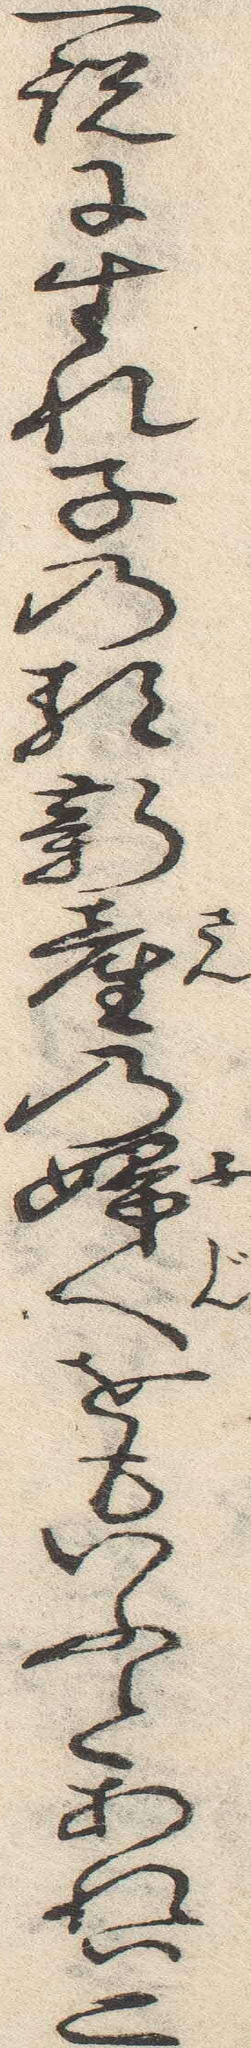一説に生れ子の類新産の婦人をもいふとあれは二
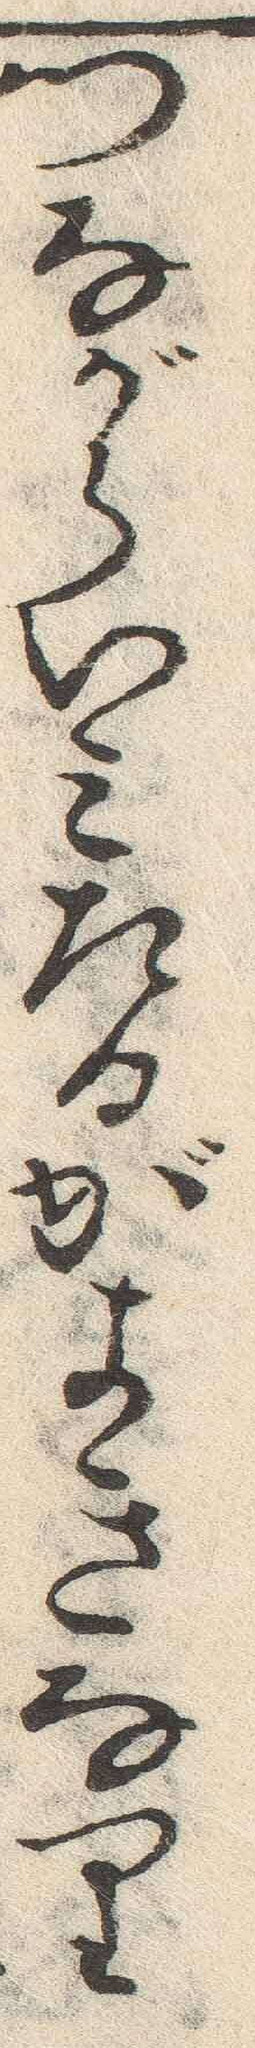ツながらいみたるがよきなり
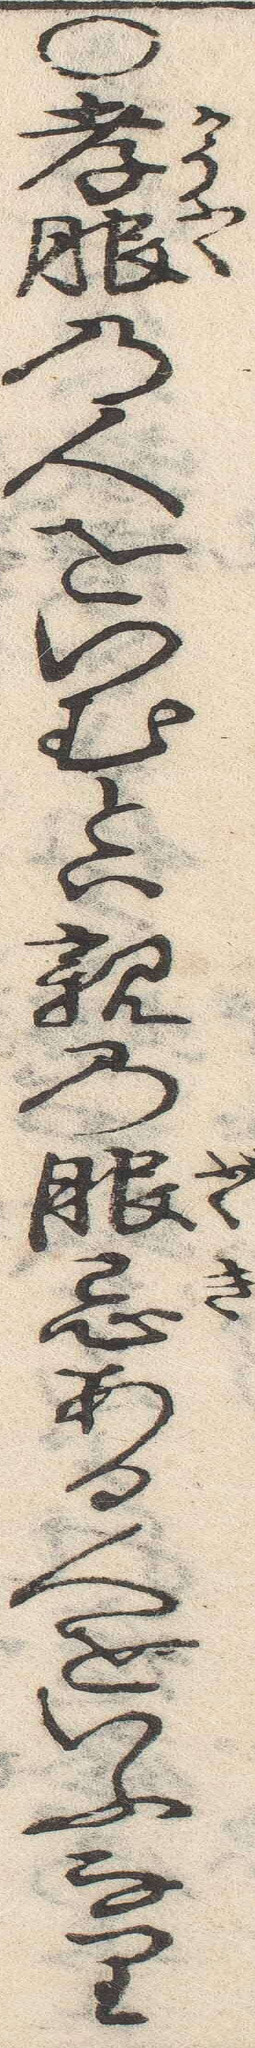○孝服の人をいむとは親の服忌ある人をいふなり
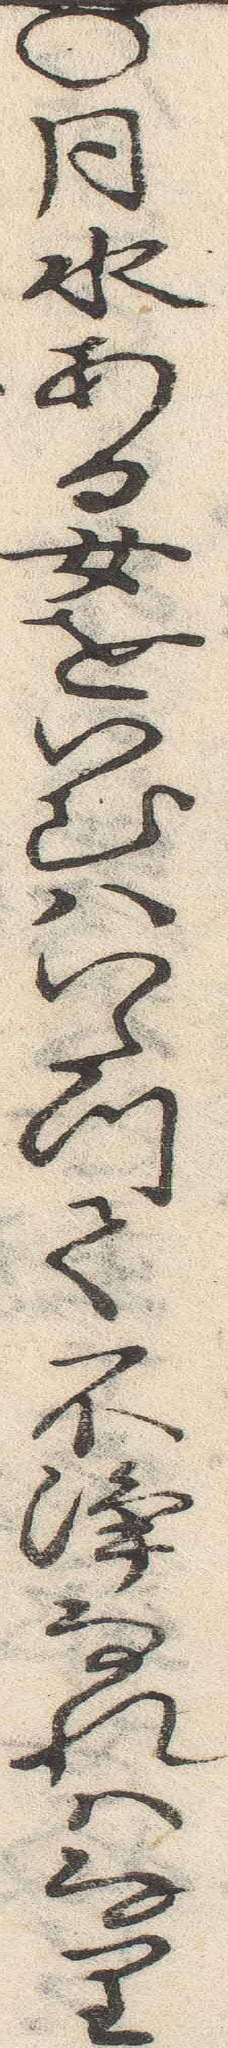○月水ある女をいむはいたつて不浄なれはなり
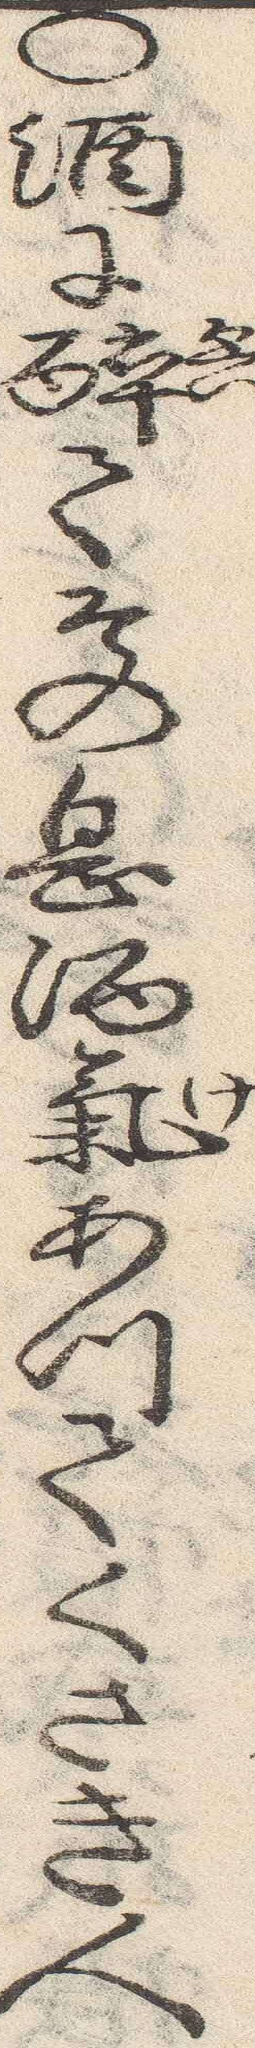○酒に醉てその息酒気あつてくさき人
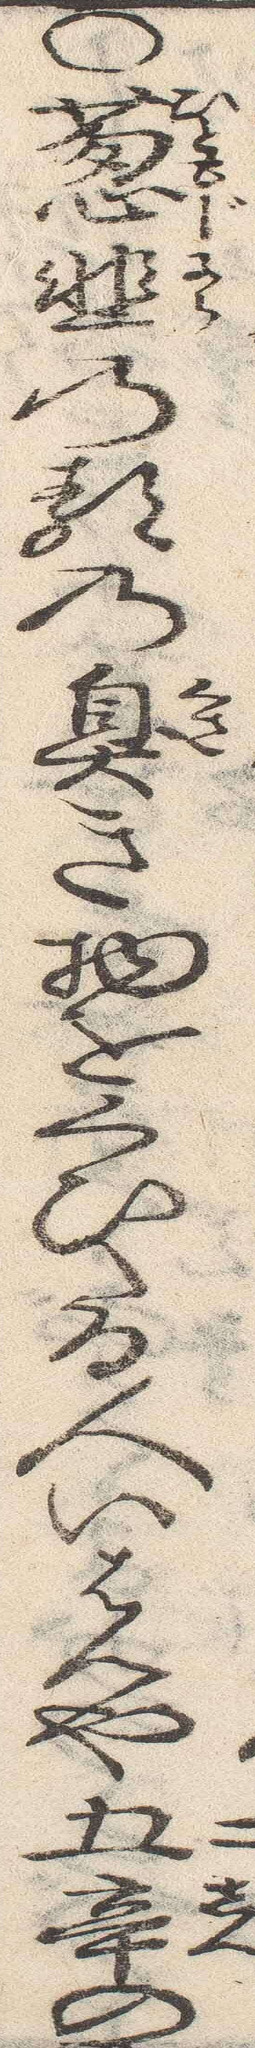○葱韭の類の臭き物をくひたる人いはんや五辛の
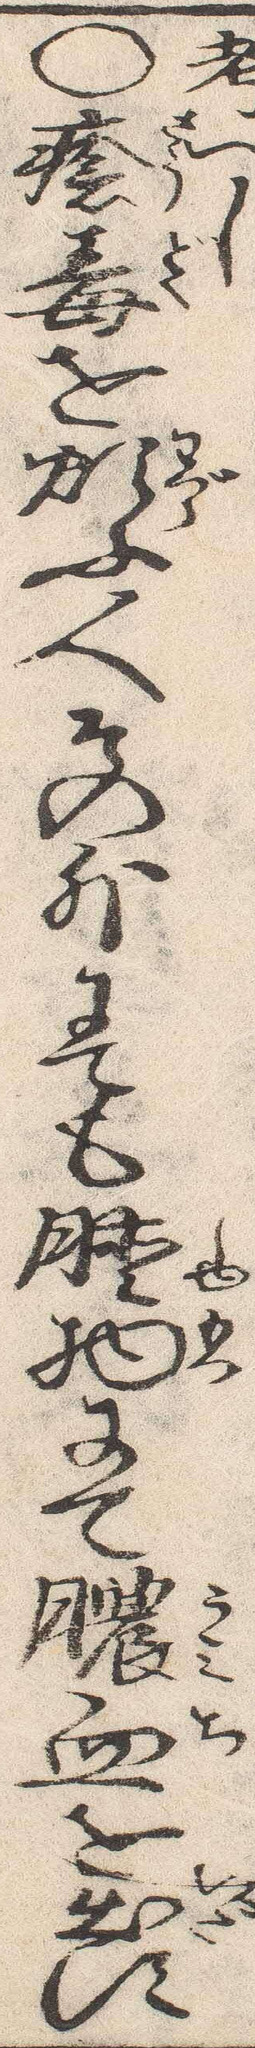○瘡毒を煩ふ人その外にても腫物にて膿血を出す
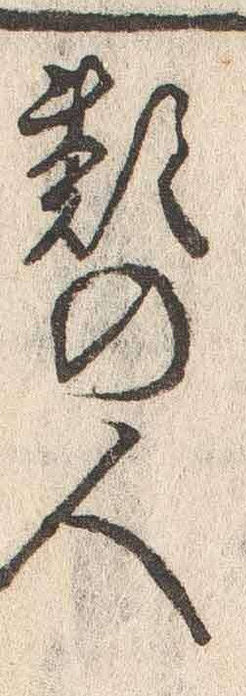類の人
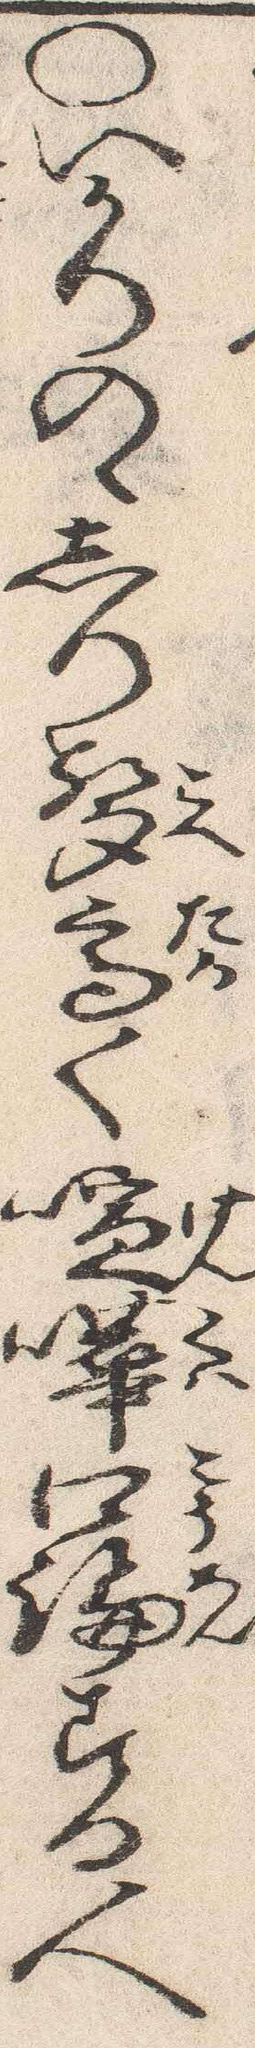○いかりのゝしり声高く喧嘩口論する人
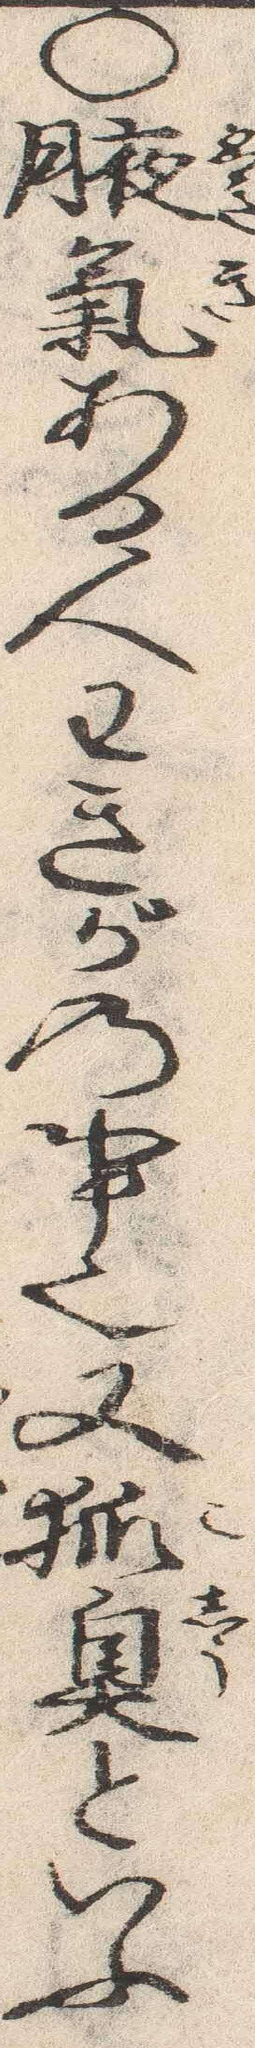○腋気ある人わきがの事也又狐臭といふ
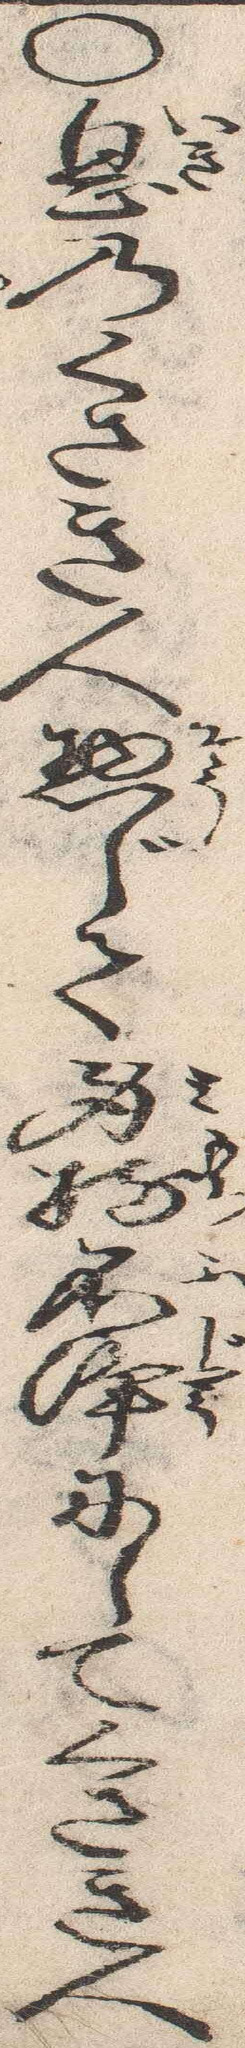○息のくさき人総じて身持不浄にしてくさき人
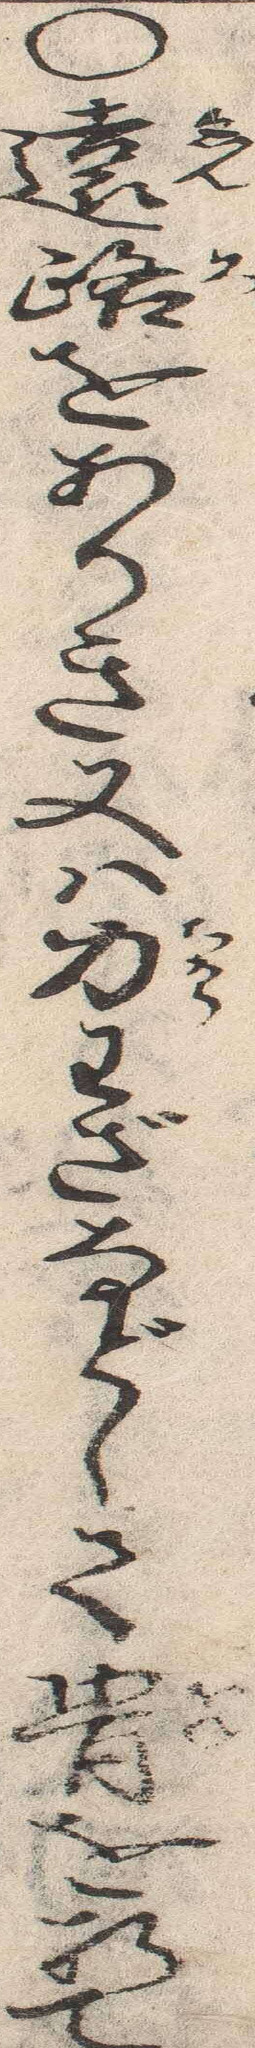○遠路をありき又は力わざなどして骨を折て
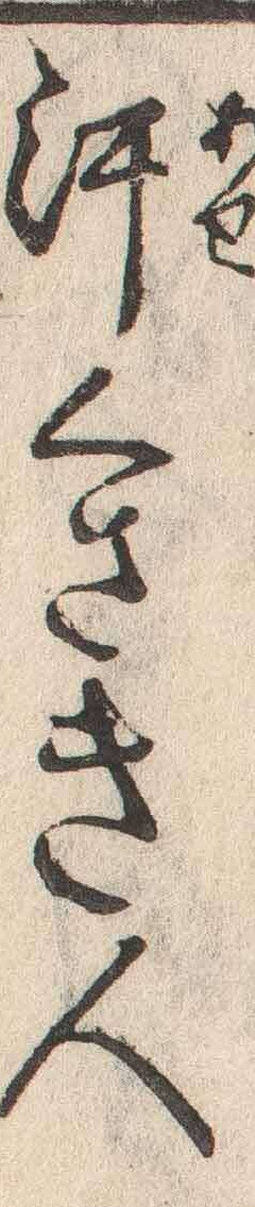汗くさき人
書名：小児必用養育草
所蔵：東京学芸大学附属図書館 国文学研究資料館
